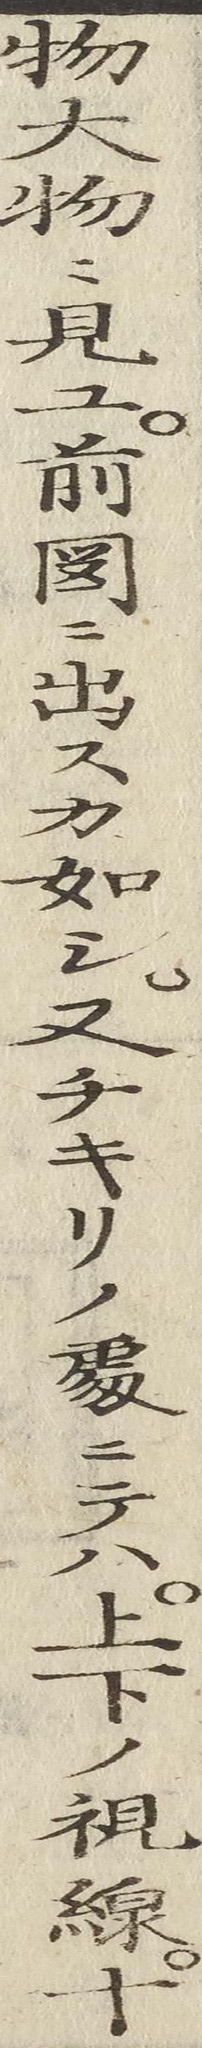物大物ニ見ユ。前図ニ出スカ如シ。又チキリノ処ニテハ。上下ノ視線。十
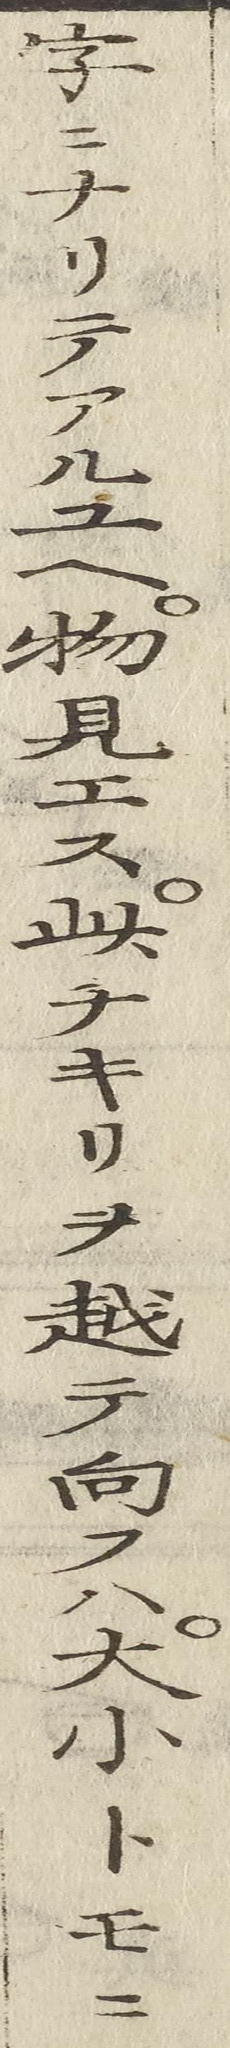字ニナリテアルユヘ。物見エス。此チキリヲ越テ向フハ。大小トモニ
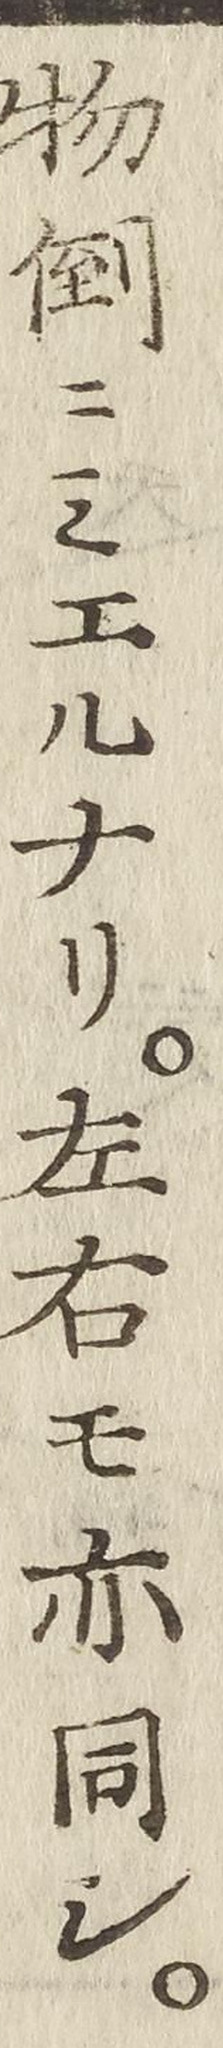物倒ニミエルナリ。左右モ亦同シ。
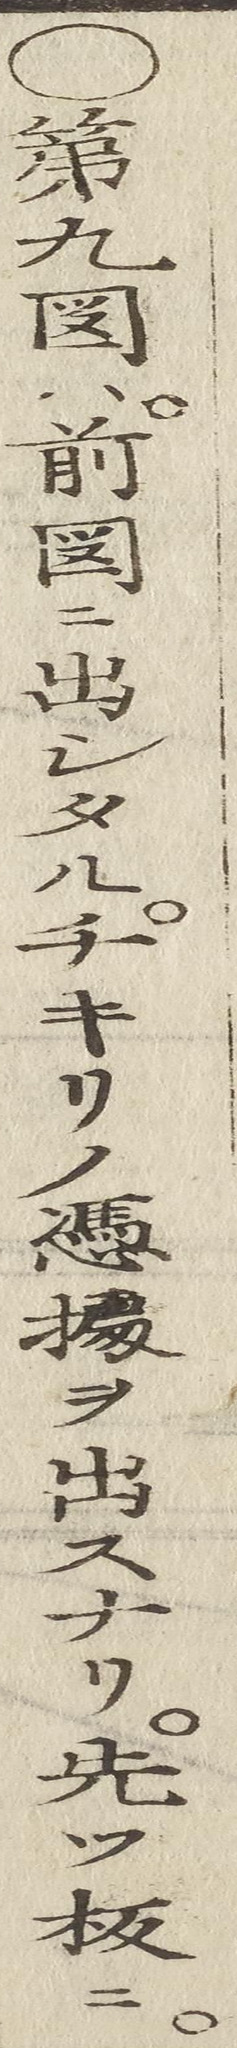○第九図ハ。前図ニ出シタル。チキリノ憑拠ヲ出スナリ。先ツ板ニ。
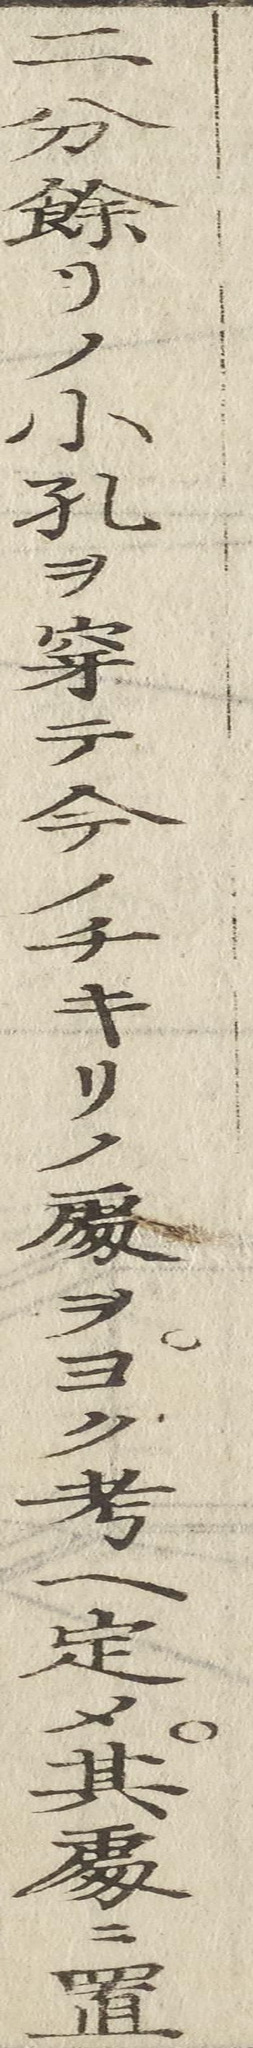二分余リノ小孔ヲ穿テ今ノチキリノ処ヲ。ヨク考ヘ定メ。其処ニ置
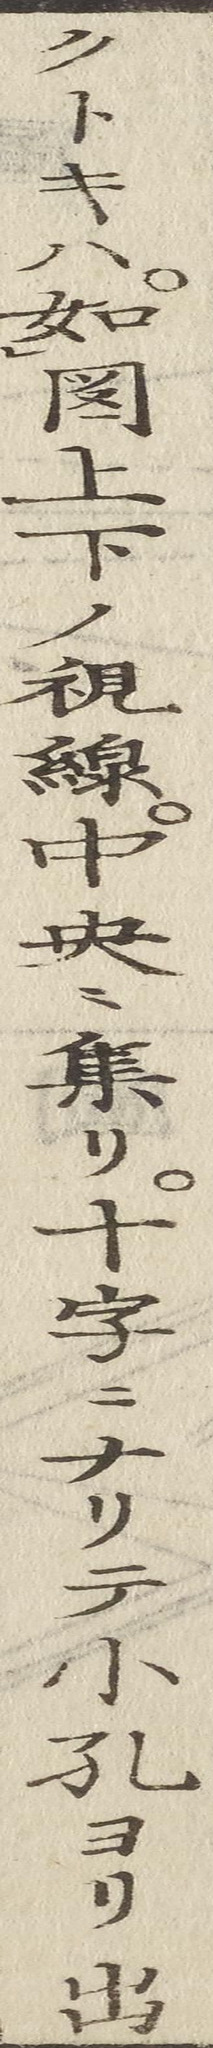クトキハ。如図上下ノ視線。中央ニ集リ。十字ニナリテ小孔ヨリ出
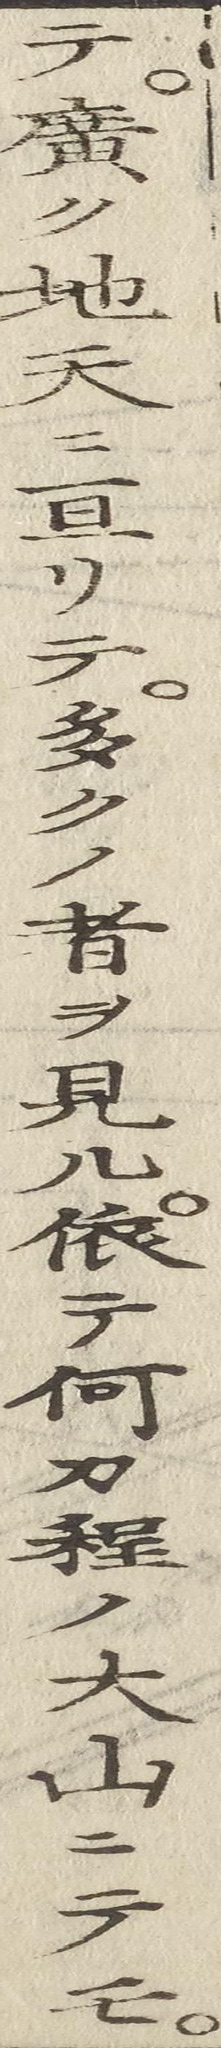テ。広ク地天ニ亘リテ。多クノ者ヲ見ル。依テ何カ程ノ大山ニテモ。
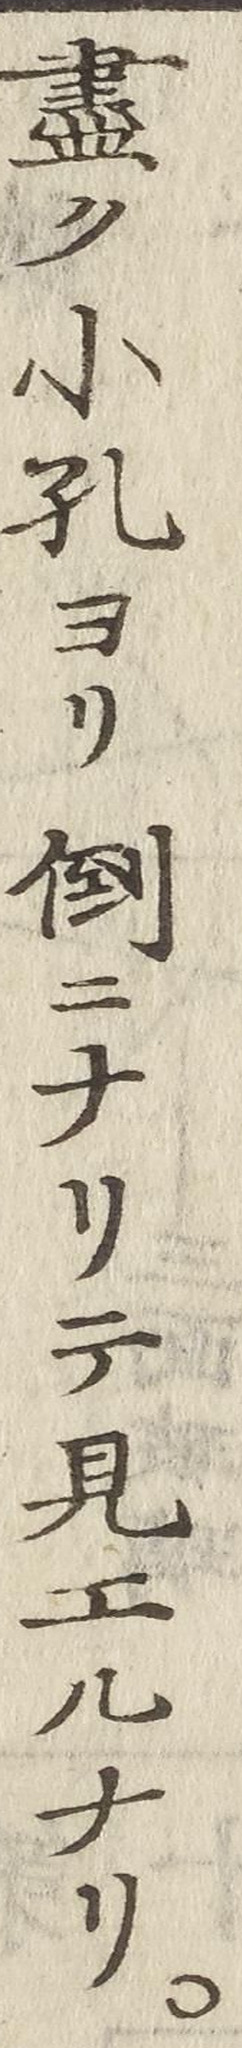尽ク小孔ヨリ倒ニナリテ見エルナリ。
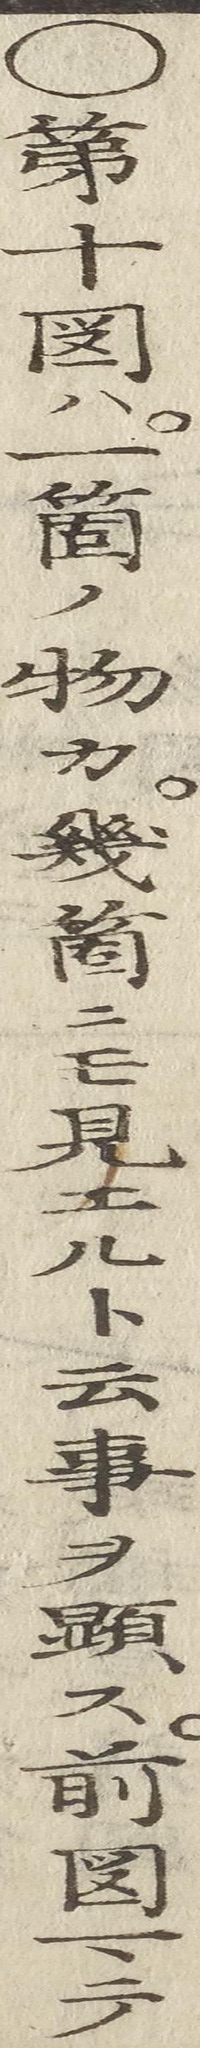○第十図ハ。一箇ノ物カ。幾箇ニモ見エルト云事ヲ顕ス。前図マテ
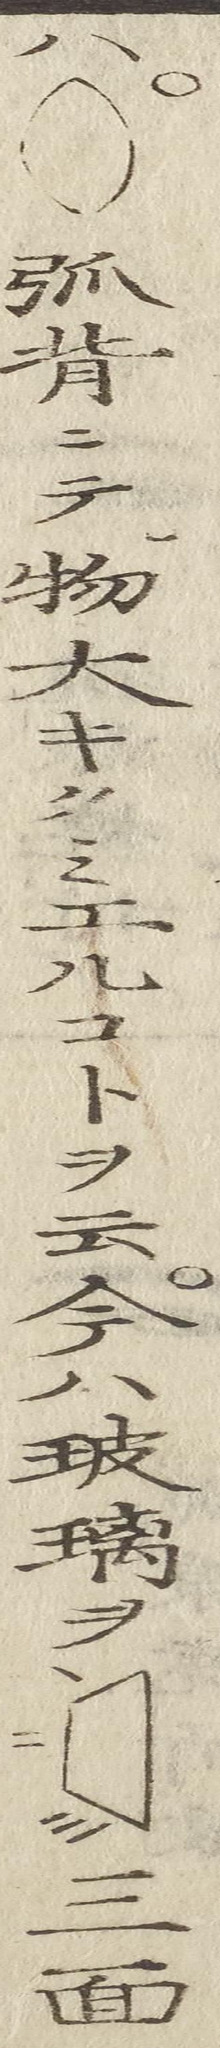ハ。弧背ニテ。物大キクミエルコトヲ云。今ハ玻璃ヲ三面

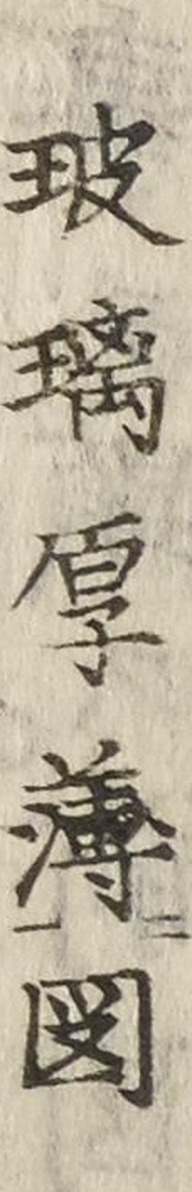玻璃厚薄二図
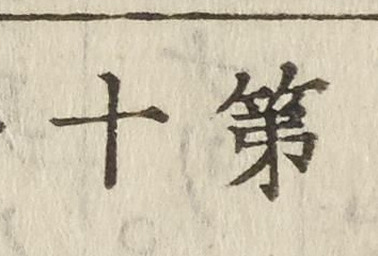第十一図
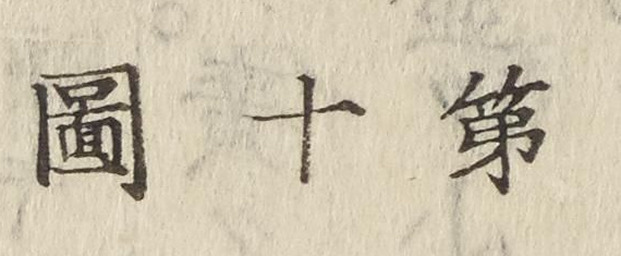第十図
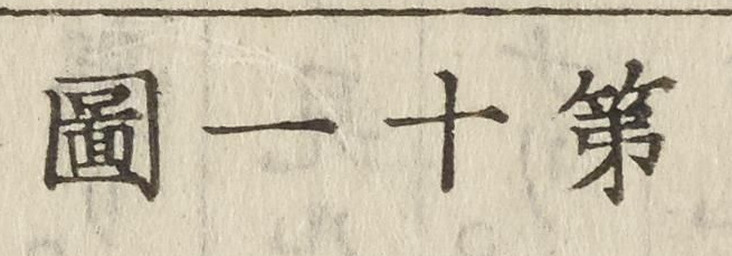第十一図
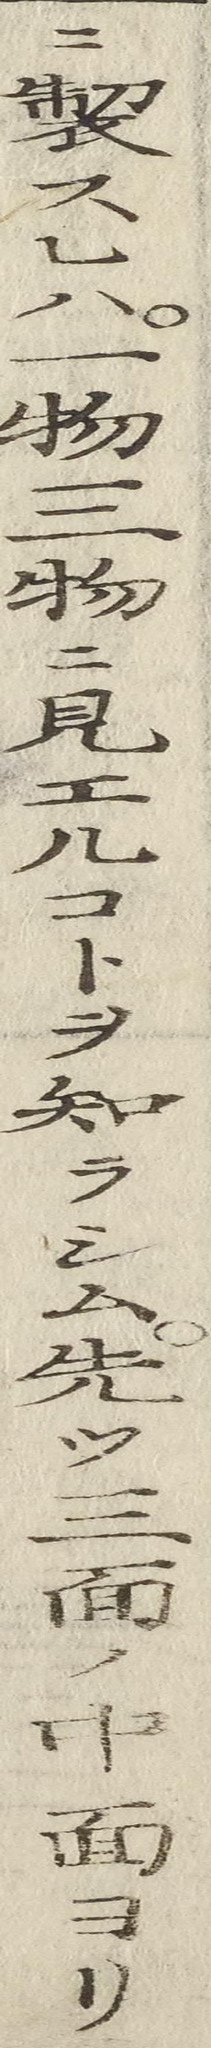二製スレハ。一物三物二見エルコトヲ知ラシム。先ツ三面ノ中面ヨリ
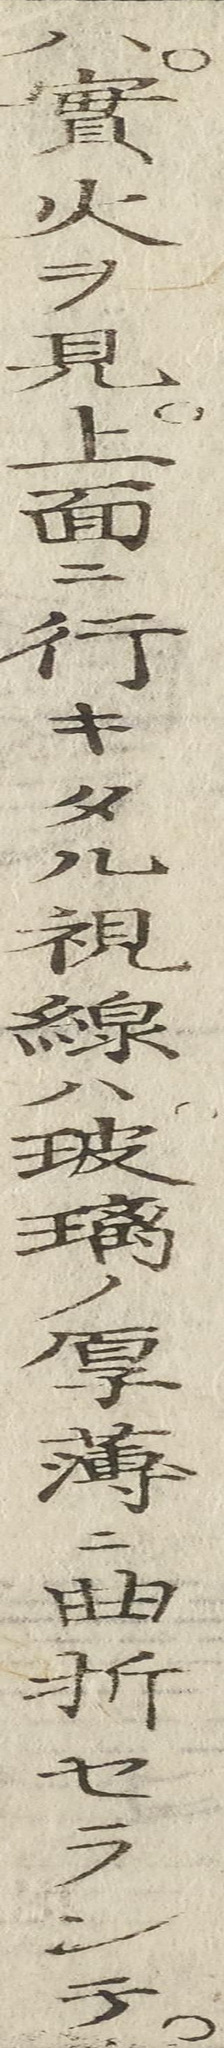ハ。実火ヲ見。上面ニ行キタル視線ハ玻璃ノ厚薄二曲折セラシテ。
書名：護法新論　上
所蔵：東京大学地震研究所図書室 Earthquake Research Institute Library, The University of Tokyo, JAPAN
